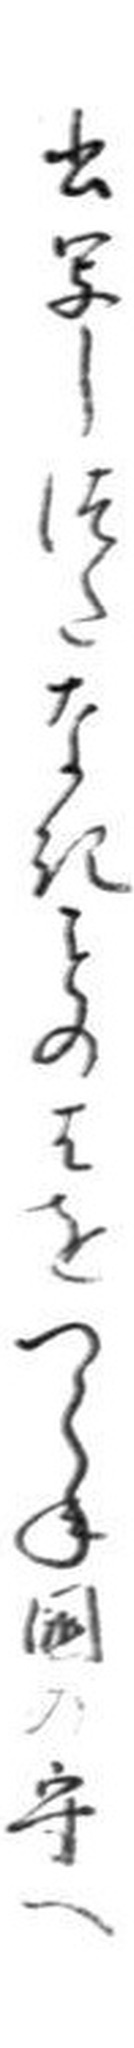書写しつたなきことのはをつらね国の守へ
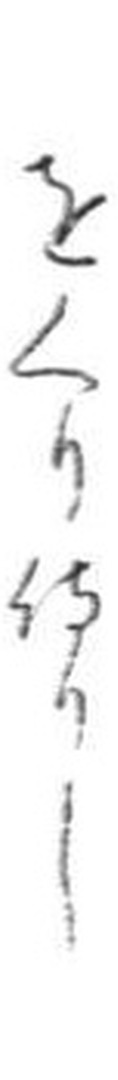をくり侍りし
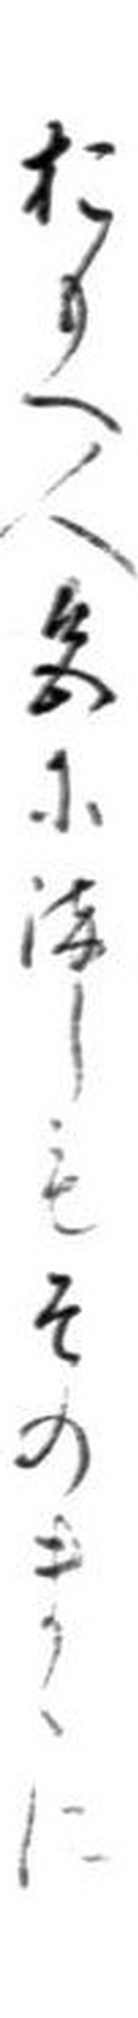おもへ人色に染しもそのまゝに
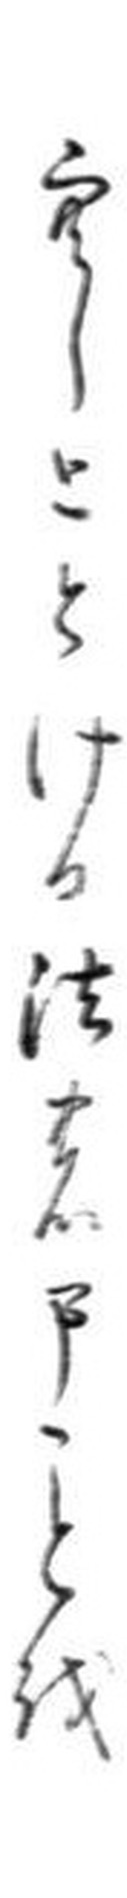空しととける法のまことを

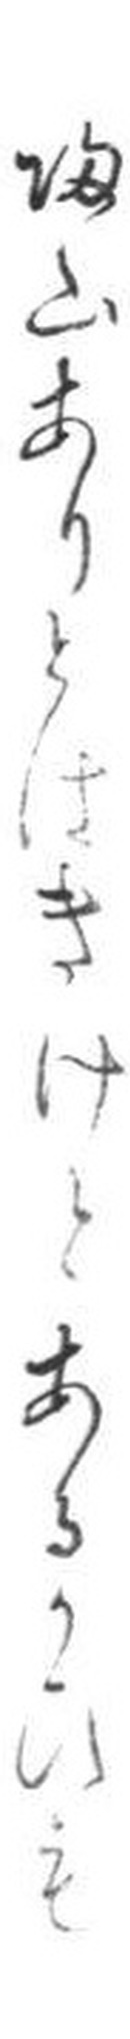帰山ありとはきけとあるかひも
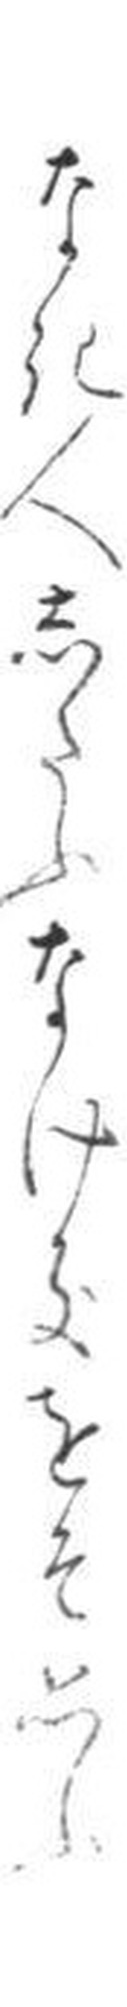なき人したふなけきをそ思ふ
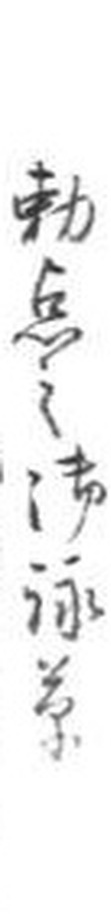勅点之御詠草
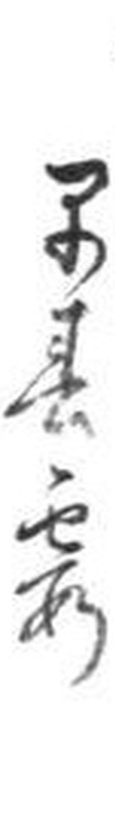早春霞
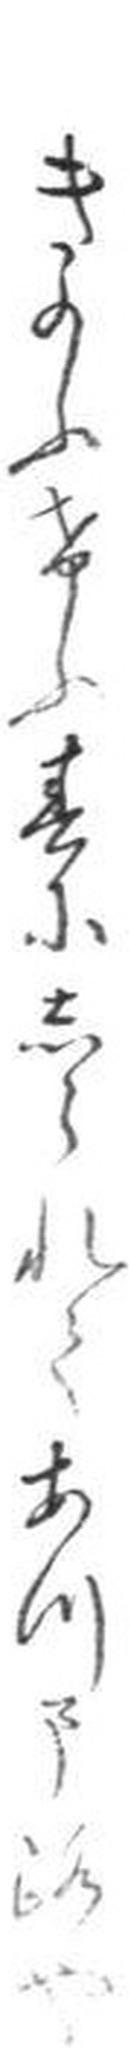きのふけふ春にしられてあつま路や
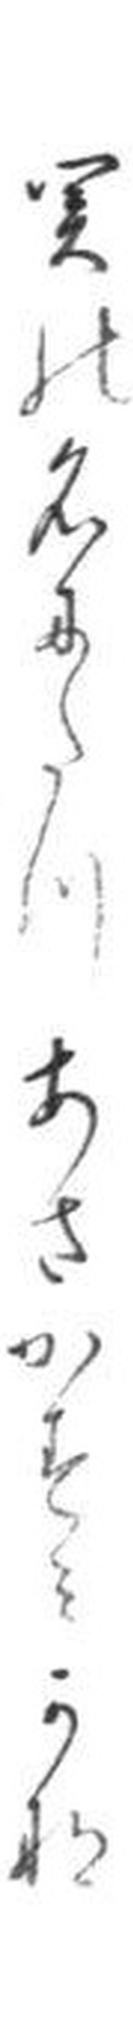関の名にたつあさかすみかな
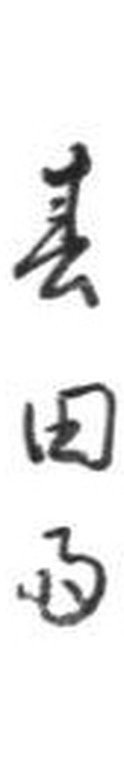春田雨
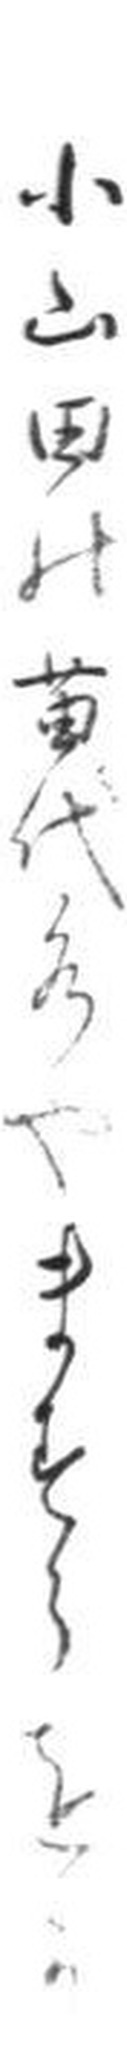小山田の苗代水やますらをか
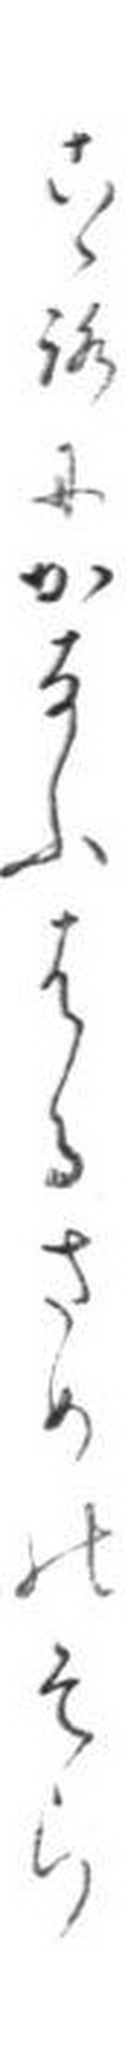こゝろにかなふはるさめのそら
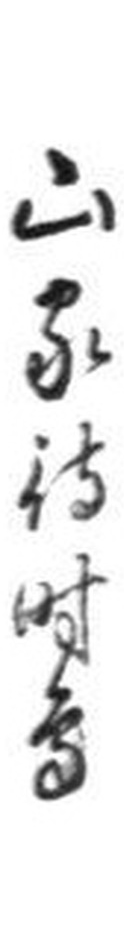山家待時鳥
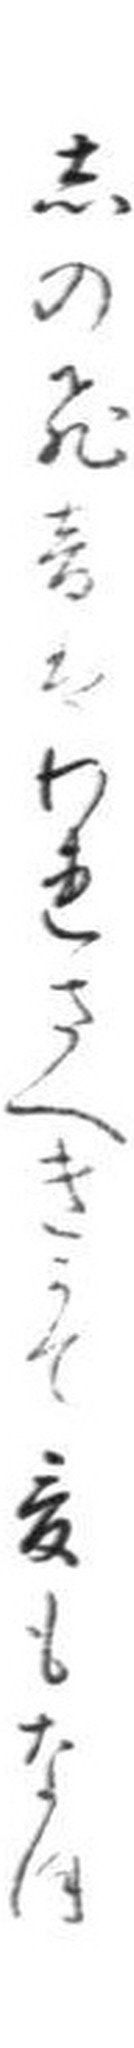しのひねはわれさへきかて爰もなほ
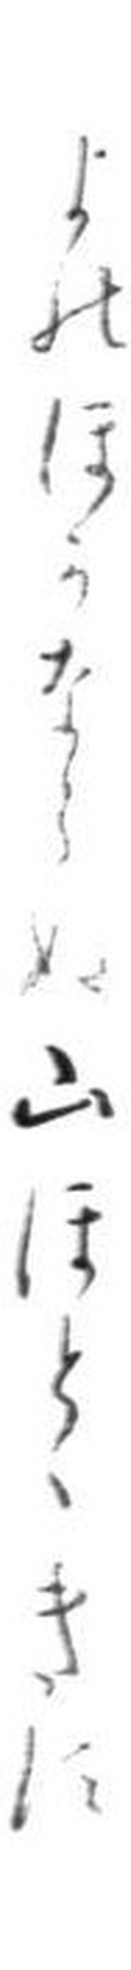よのほかならぬ山ほとゝきす
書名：家譜 八 光通公 従寛文十年到同十二年
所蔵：福井県文書館 Fukui Prefectural Archives
